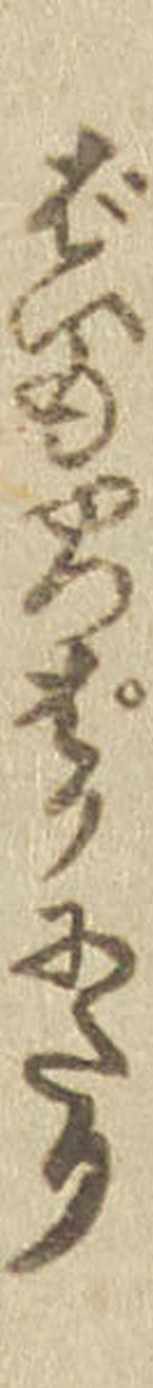ばいもやつぱりにたり
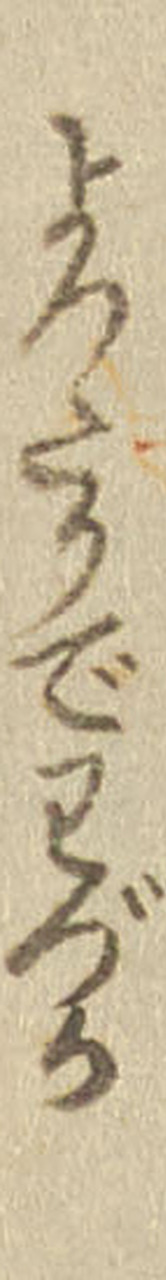よつたりでわづか
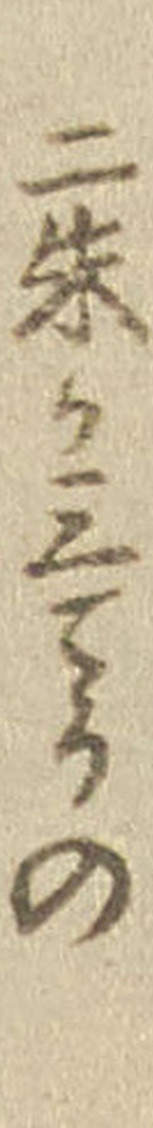二朱か三てうの
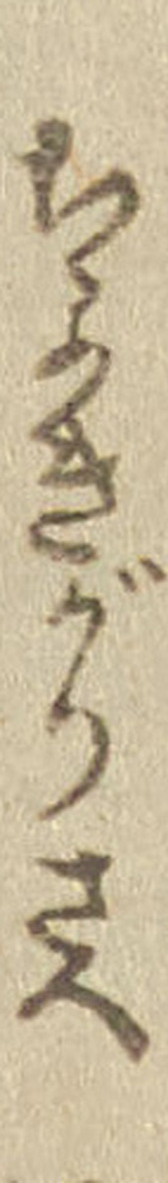ちよきがりさへ
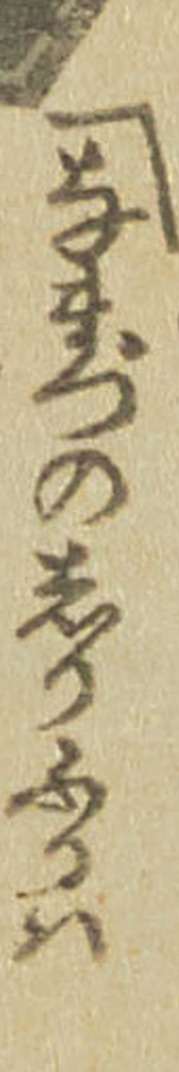「なまづのしりふるは
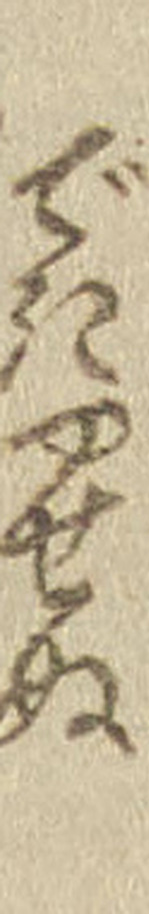できやせぬ
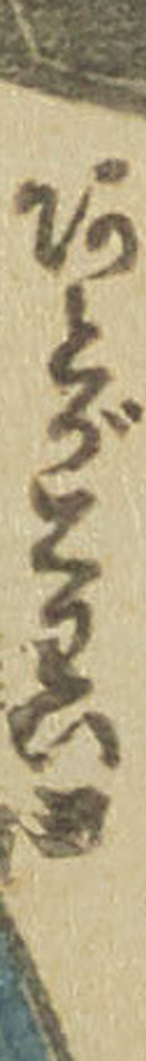あとがこわい
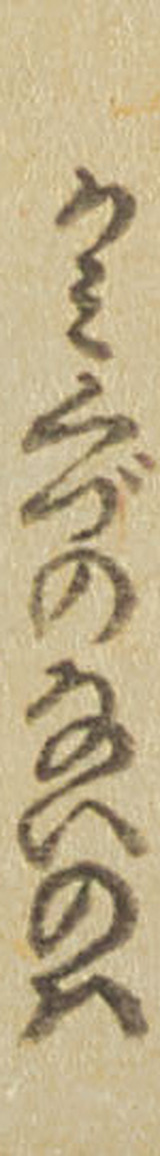かみくづのないのは
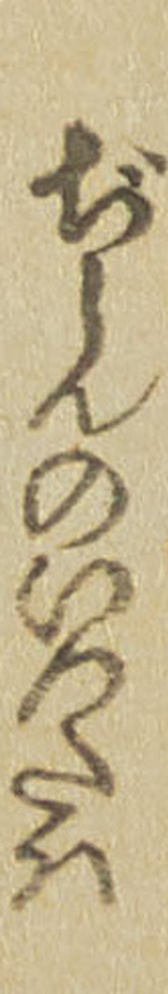ぢしんのいつたは
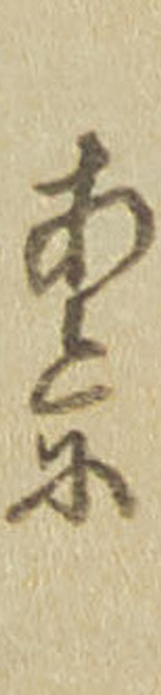あとに
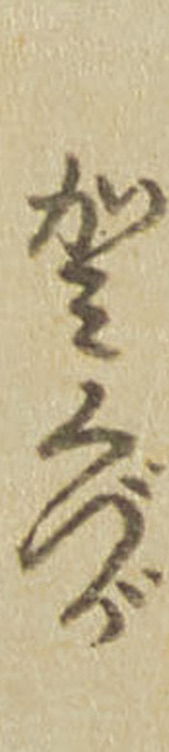かみくづが
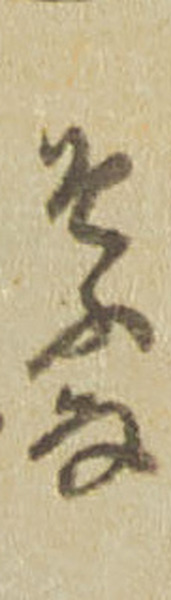そふな
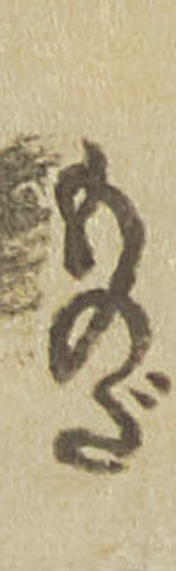ものだ
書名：骨抜どうせうなまづ大家破焼
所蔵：東京大学総合図書館 General Library in the University of Tokyo, JAPAN
